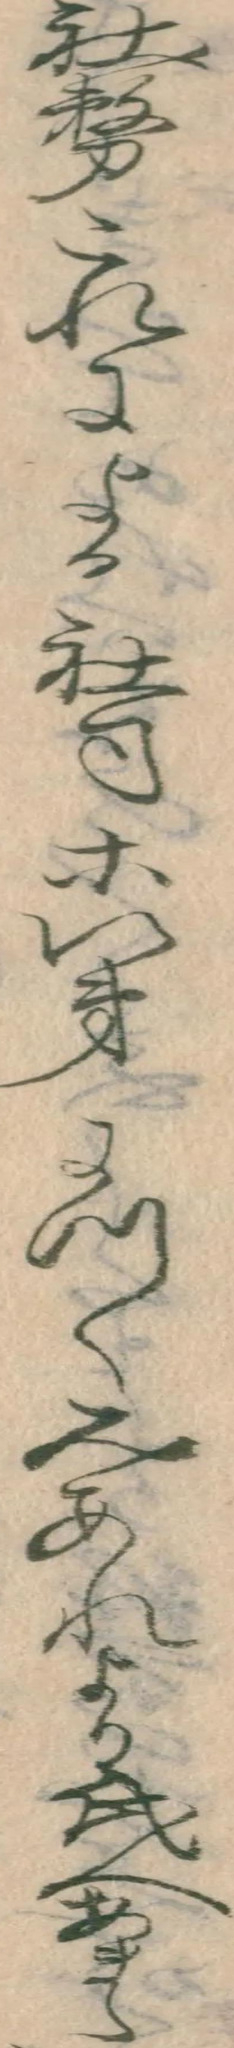社務これによる社司等次第につくみあれより氏人あまた
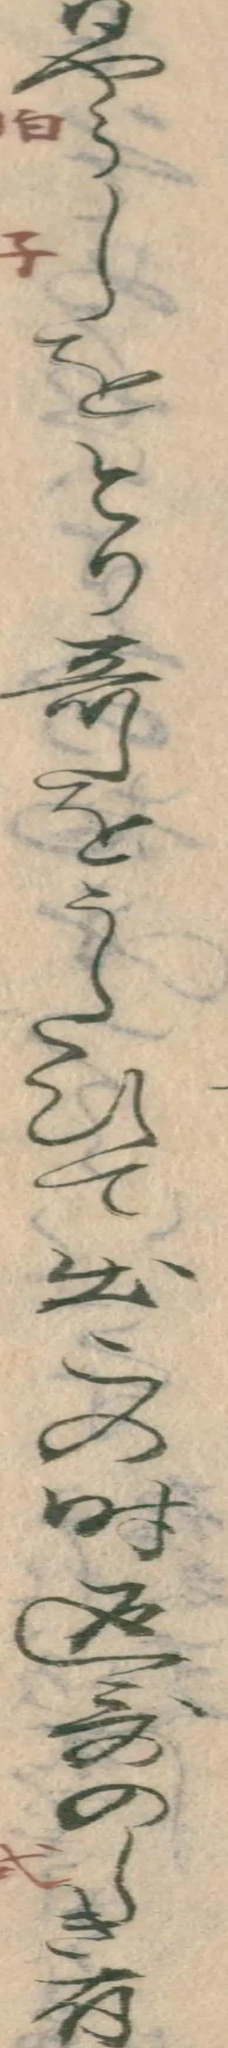ひやうしをとり哥をうたひて出この時返哥のしき有
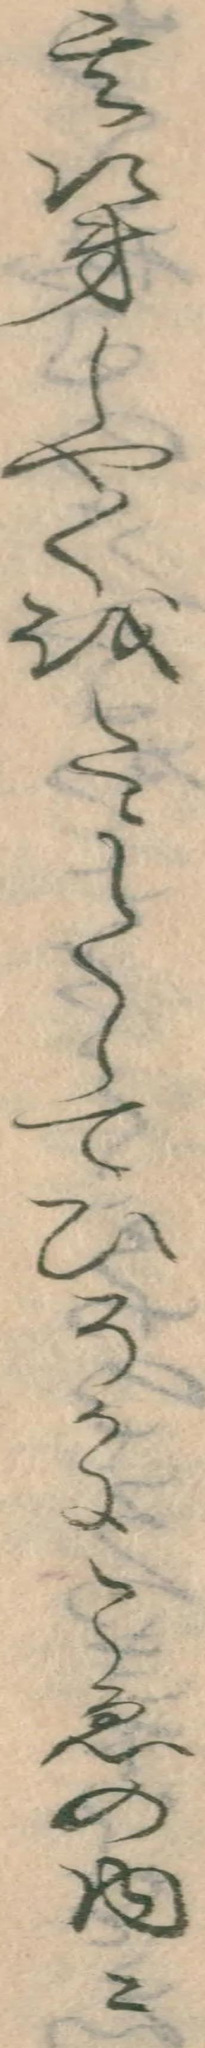其次第しやくをたゝしくしてひそかにこゑの内に
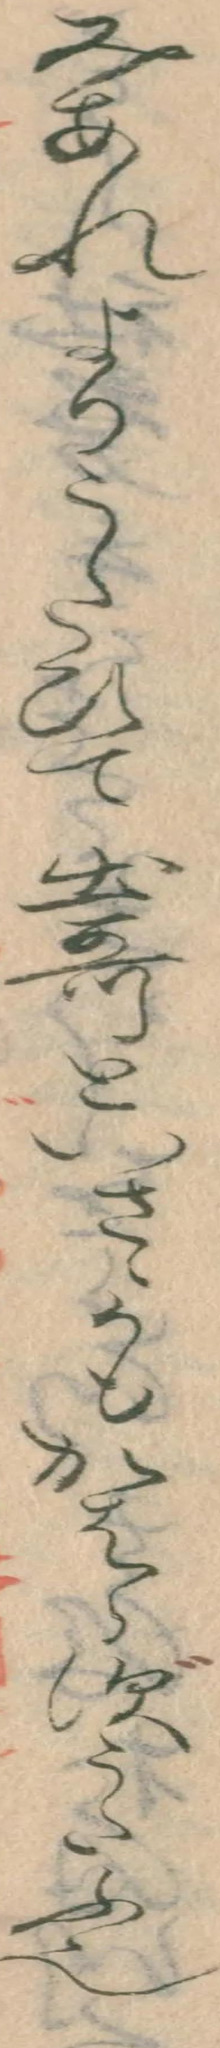みあれよりうたひて出哥といさゝかもかはらずうたふ也

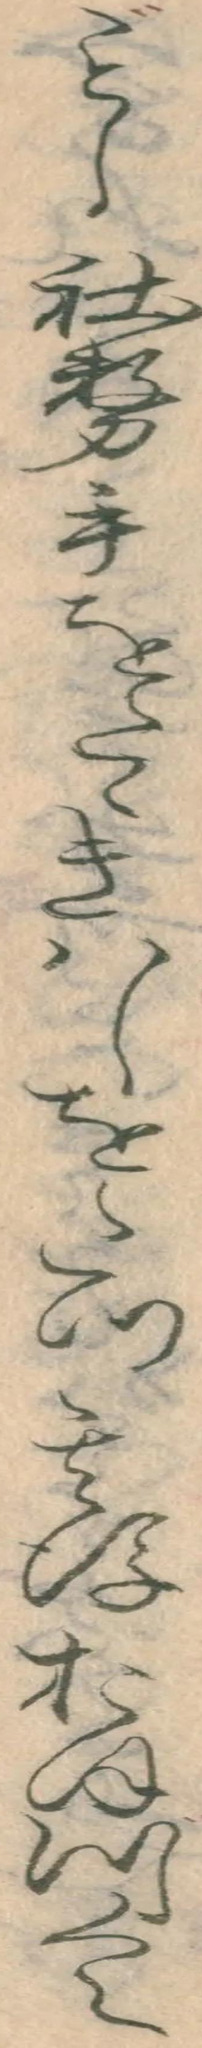ごとし社務手をたゝきはしをたつ其後おほづくえ
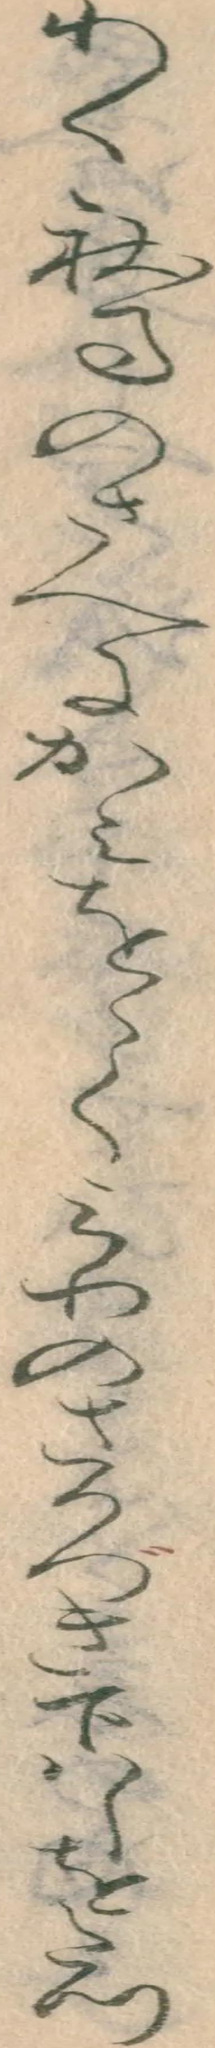わく社司のまへにかみをゝくみりのさかづき下はしをたつ
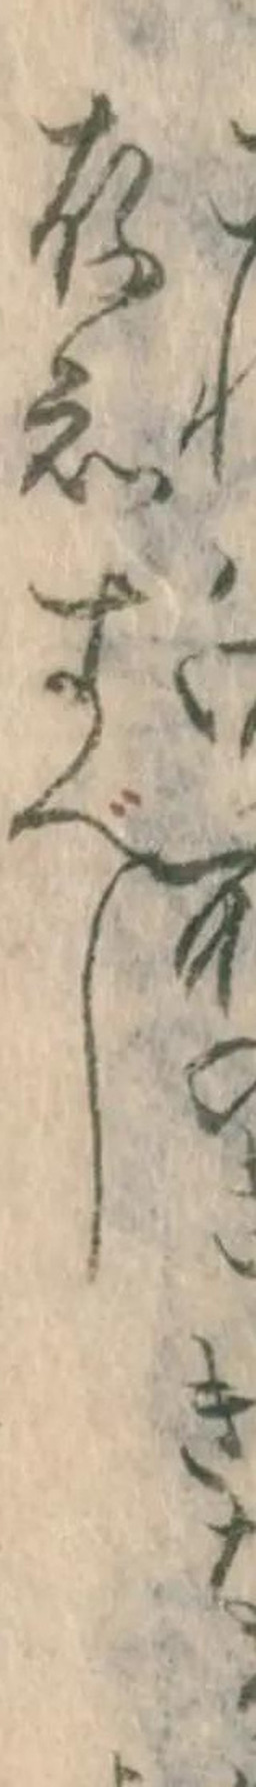存知すべし
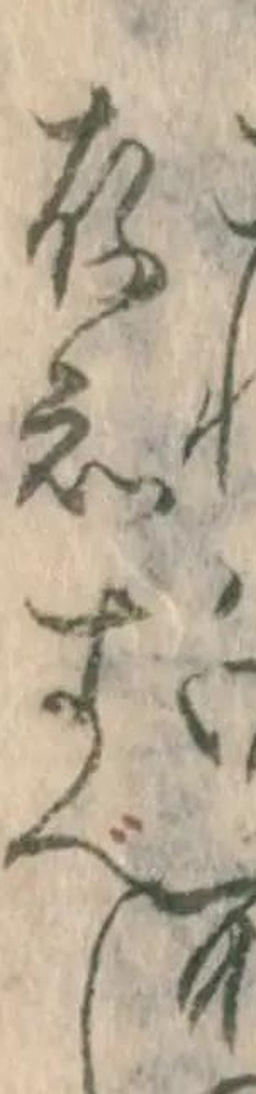存知すべし
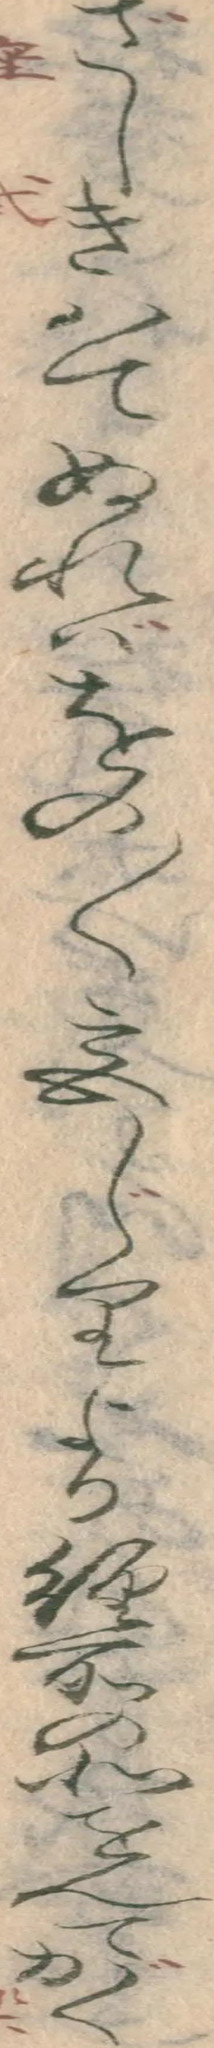ざしきはてぬればをの〳〵宮じりより経所の北をんてがく
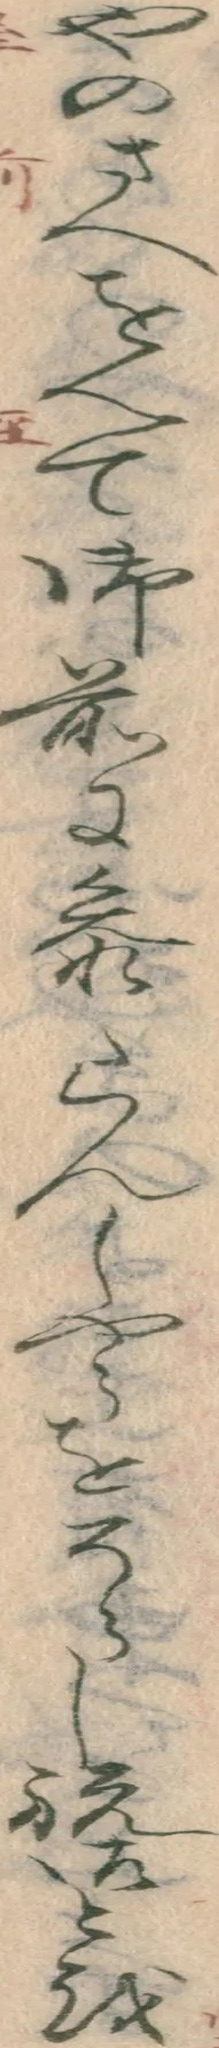やのまへをへて御前に参らんしやうをそうし祝御とを
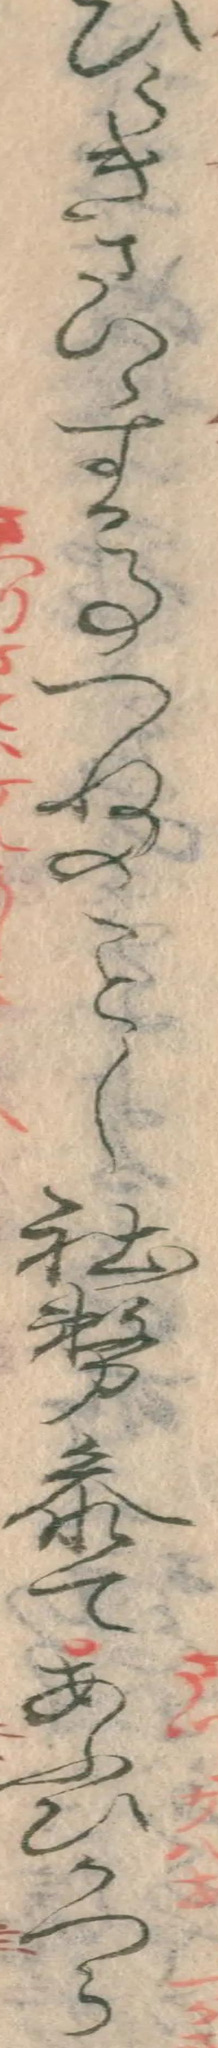ひらきまいらする事つねのことし社務参て◦あふひかつら
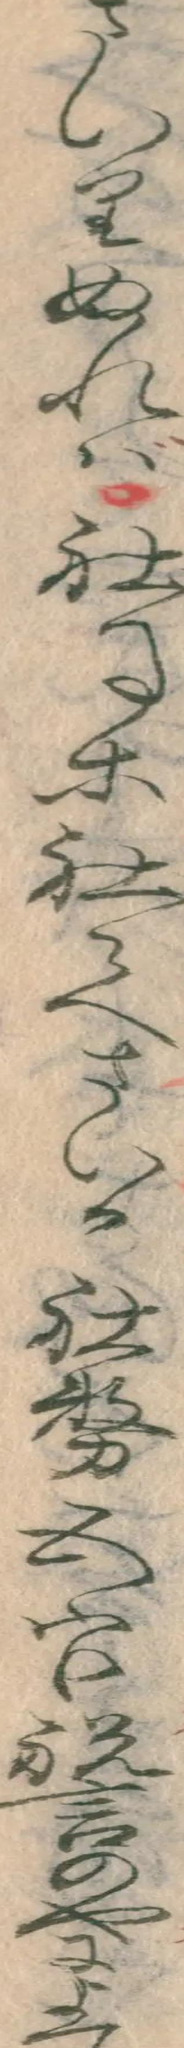まいりぬれば◦社司等社々へまいる社務五官祝言のやによて
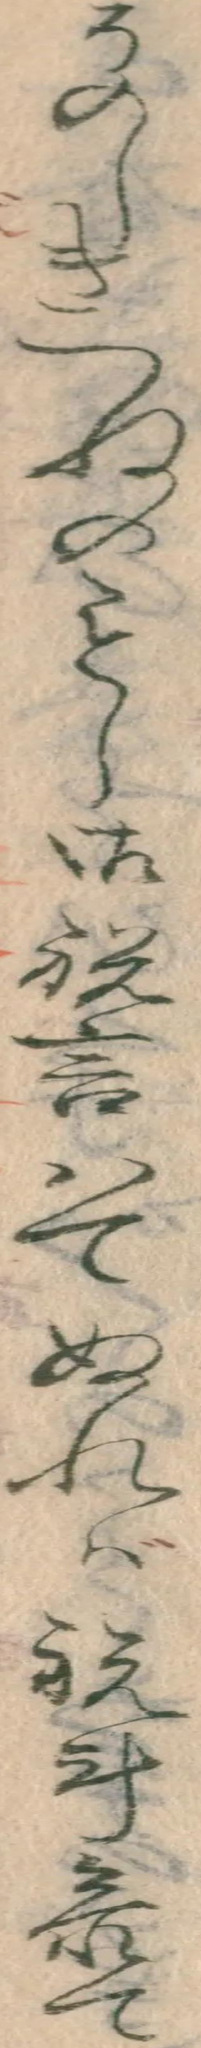そのしきつねのことし御祝言はてぬれば祝計参て
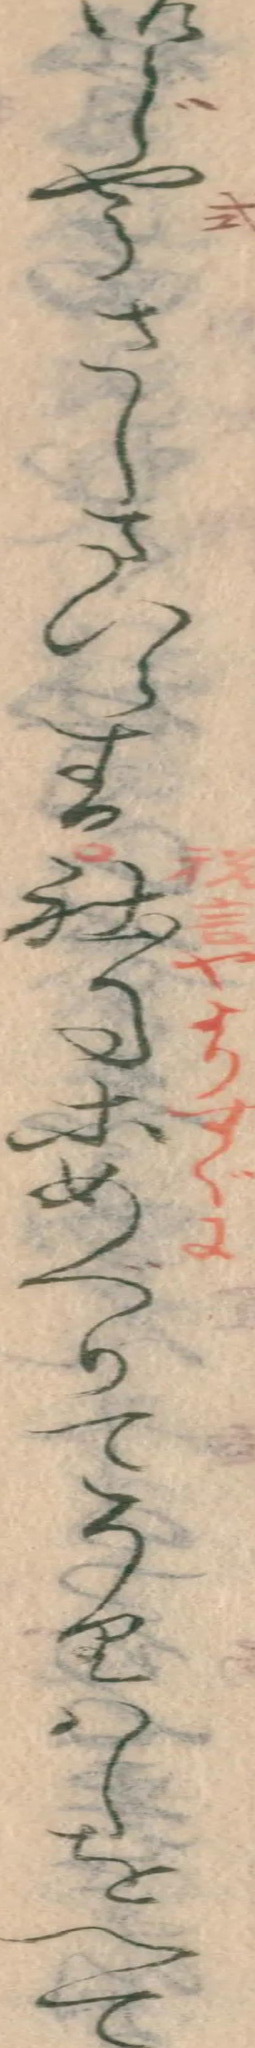御じやうさしまひらする◦社司等めぐりてそりはしをへて
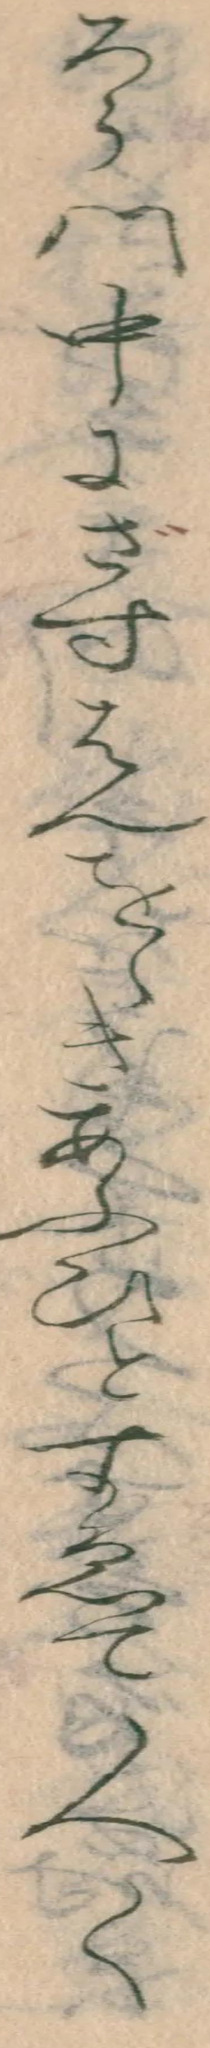ろう門中にざすはんをゝきあふひとすゑて人〳〵
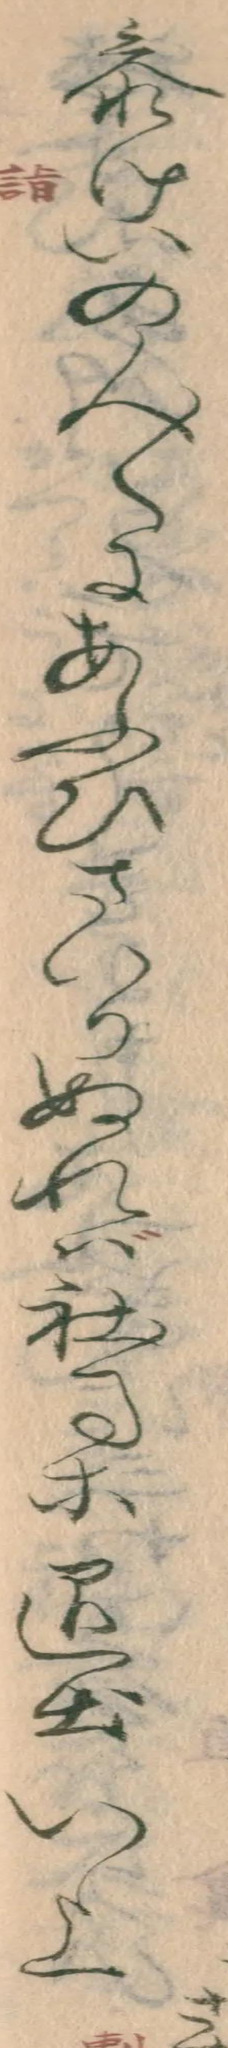参けいの人〳〵にあふひまいりぬれば社司等退出い上
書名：賀茂社記録. 第3冊
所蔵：国立国会図書館 National Diet Library, JAPAN
